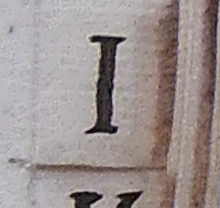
I
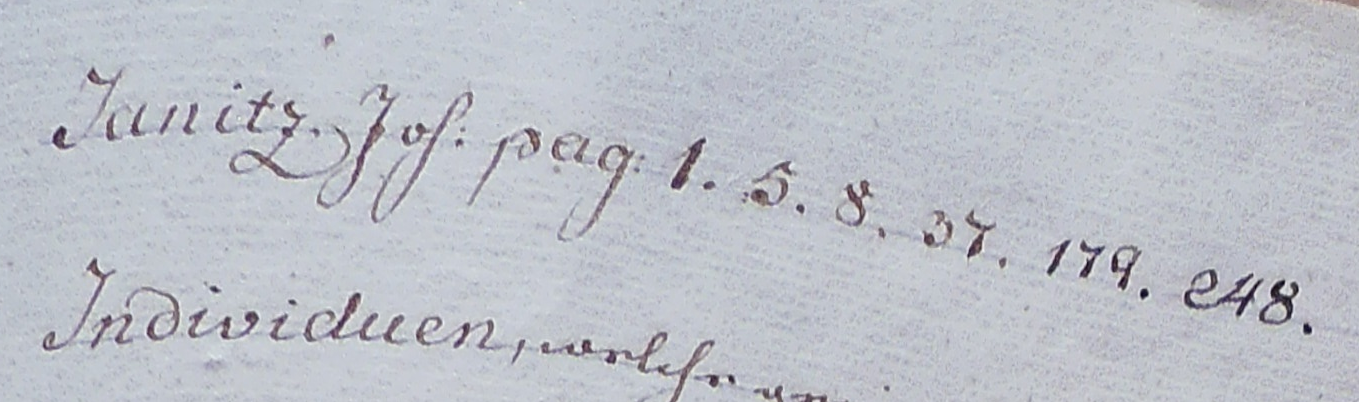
Janitz. Joh: pag: 1. 5. 8. 37. 179. 248.
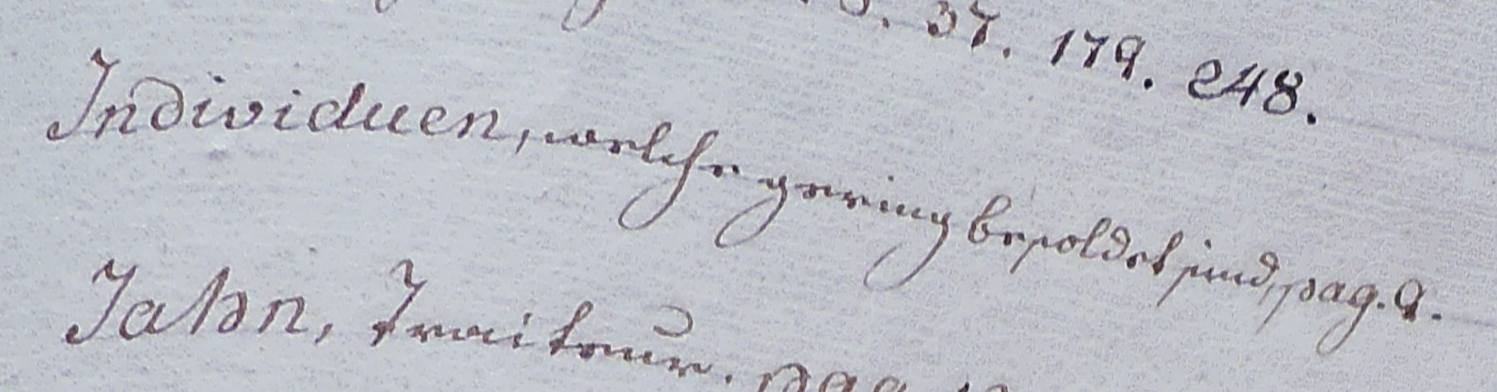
Individuen, welche gering besoldet sind. pag. 9.
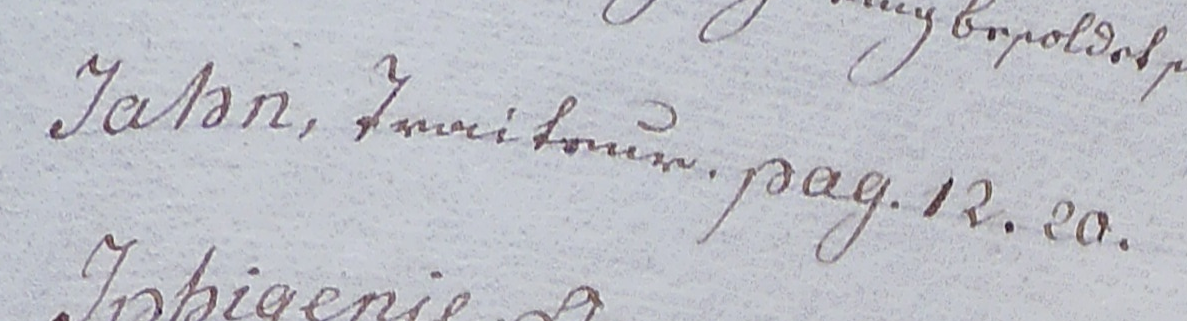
Jahn, Traiteur. pag. 12. 20.
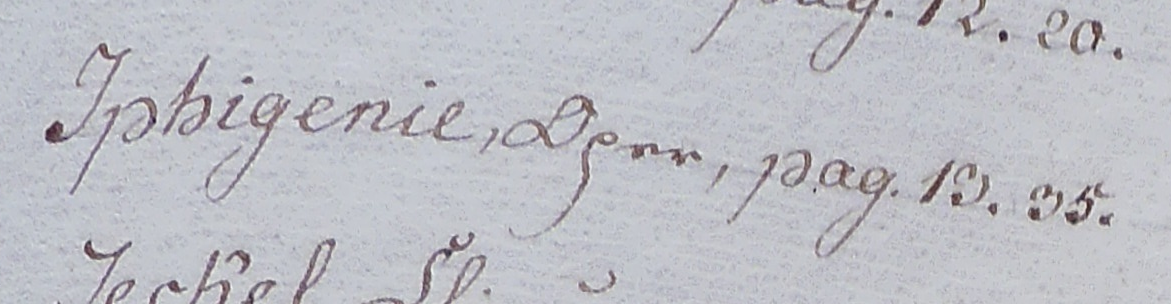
Iphigenie, Oper, pag. 13. 35.
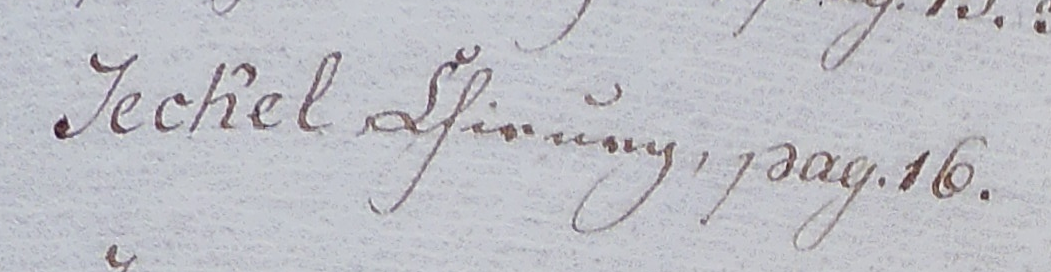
Jeckel, Chirurg, pag. 16.
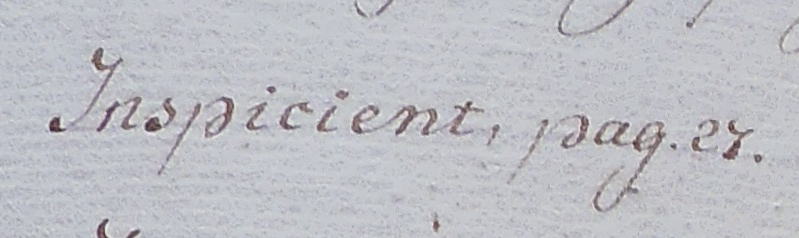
Inspicient, pag. 27.
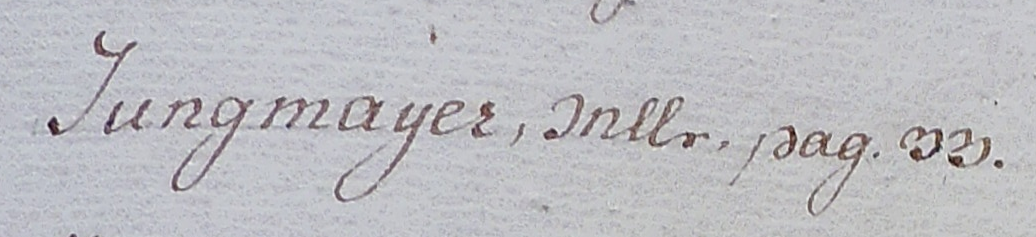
Jungmayer, Mlle. pag. 33.
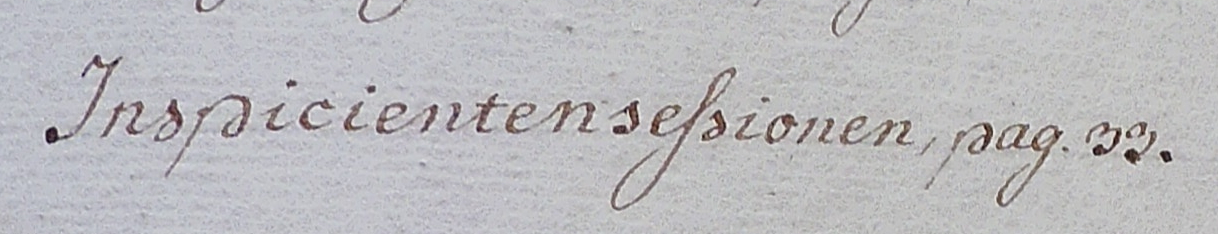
Inspicientensessionen, pag. 33.
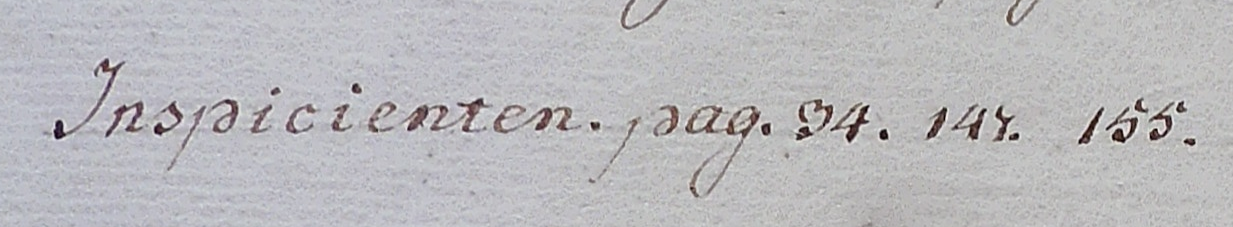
Inspicienten. pag. 34. 147. 155.
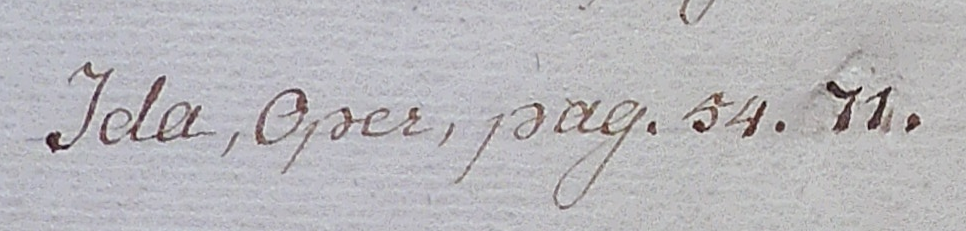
Ida, Oper, pag. 54. 71.
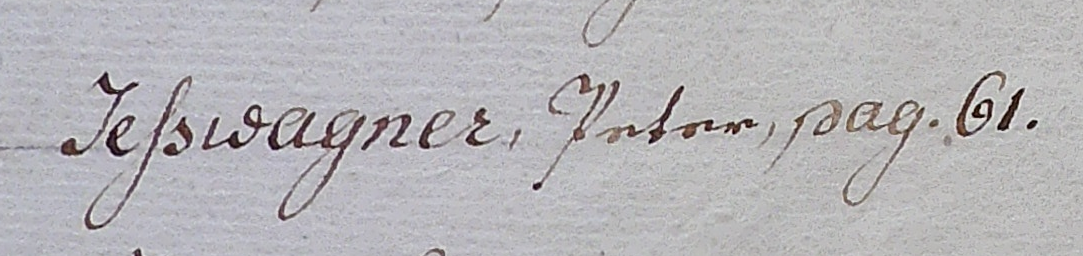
Jesswagner, Peter, pag. 61.
